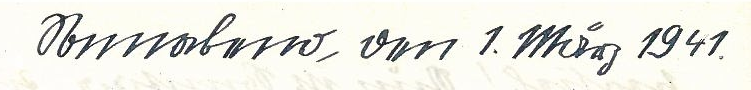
Sonnabend, den 1. März 1941.
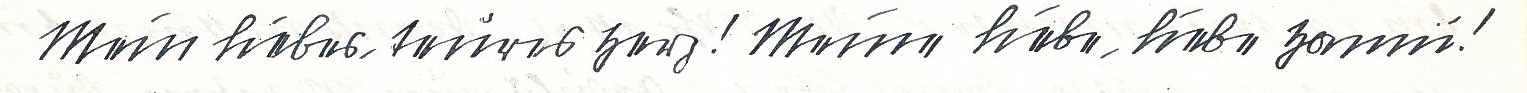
Mein liebes, teures Herz! Meine liebe, liebe!
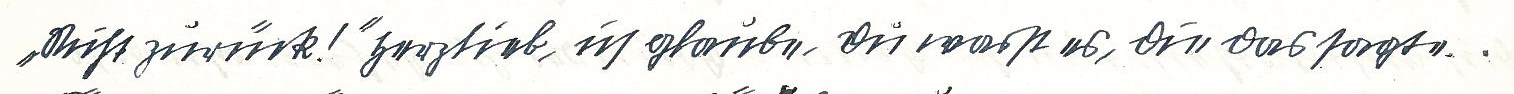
„Nicht zurück!” Herzlieb, ich glaube, Du warst es, die das sagte.
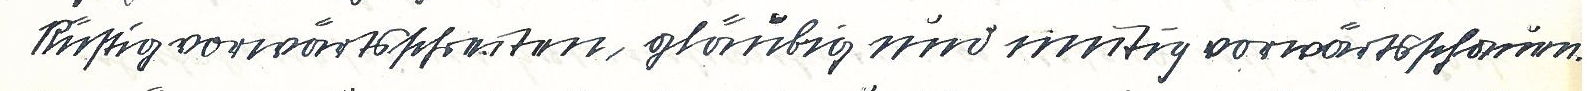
Rüstig vorwärts schreiten, gläubig und mutig vorwärts schauen –
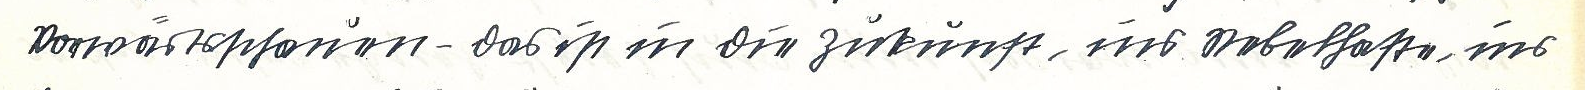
vorwästschauen – Das ist in die Zukunft, ins Nebelhafte ins
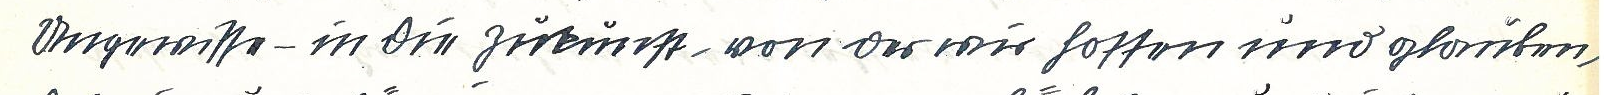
Ungewisse – in die Zukunft, von der wir hoffen und glauben,
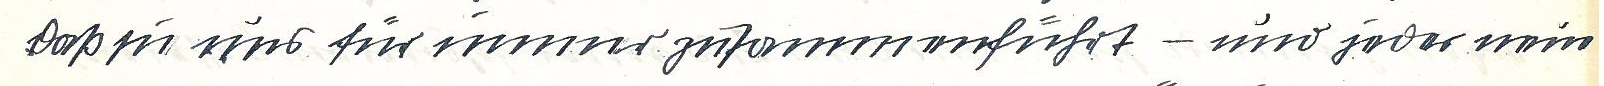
daß sie uns für immer zusammenführt – und jeder wein
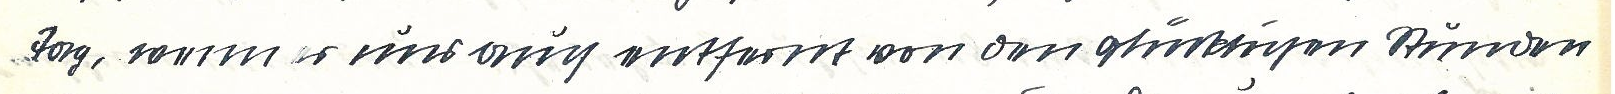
Tag, wenn er uns auch entfernt von den glücklichen Stunden
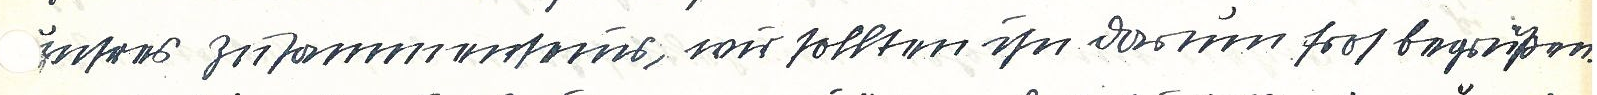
nseres Zusammenseins, wir sollten ihn darum froh begrüßen.
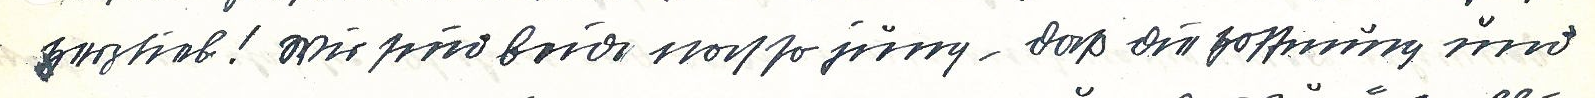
Herzlieb! Wir sind beide noch so jung, daß die Hoffnung und
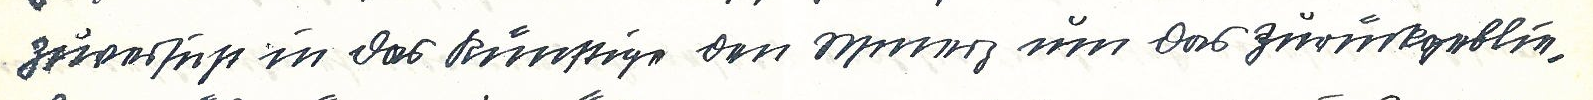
Zuversicht in das Künftige den Schmerz um das Zurückgeblie¬
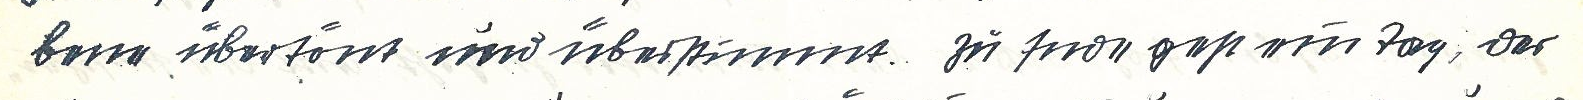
bene übertönt und überstimmt. Zu Ende geht ein Tag, der
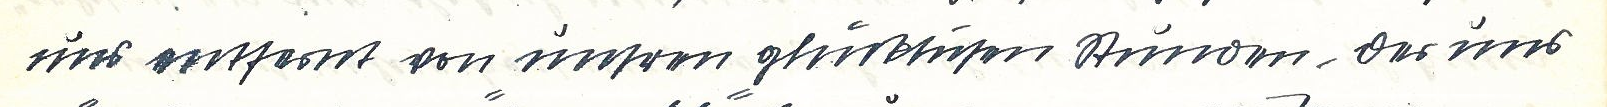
uns entfernt von unseren glücklichen Stunden, der uns
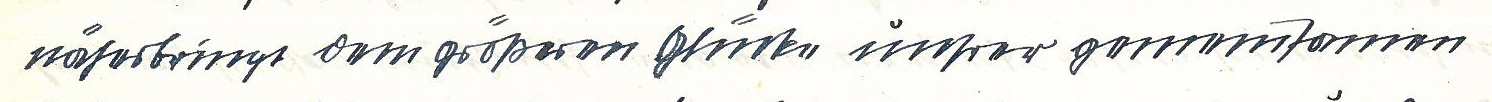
näher bringt dem größeren Glücke unserer gemeinsamen
